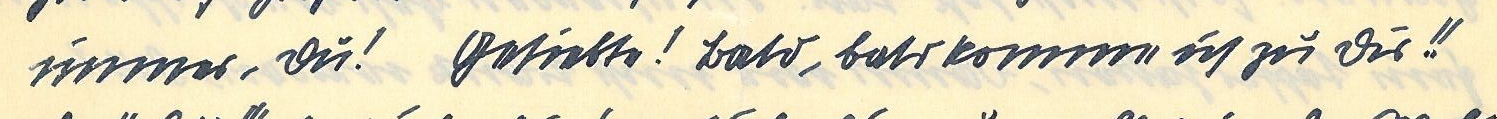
immer, Du! Geliebte! Bald, bald komme ich zu Dir!!
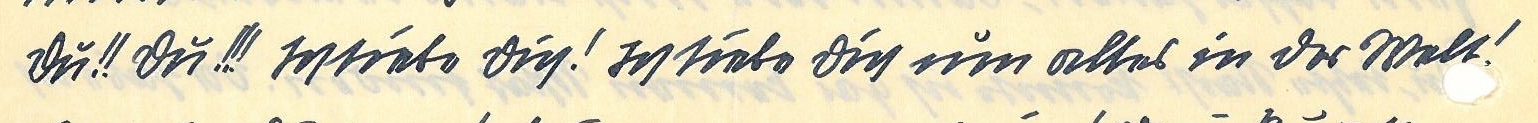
Du!! Du!!! Ich liebe Dich! Ich liebe Dich um alles in der Welt!
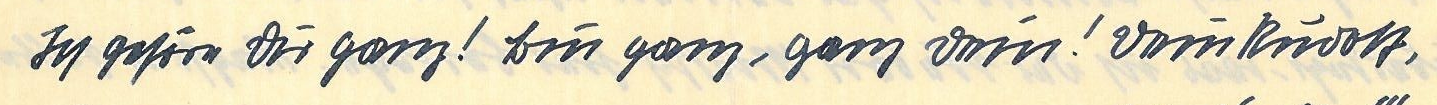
Ich gehöre Dir ganz! Bin ganz, ganz Dein! Dein ,
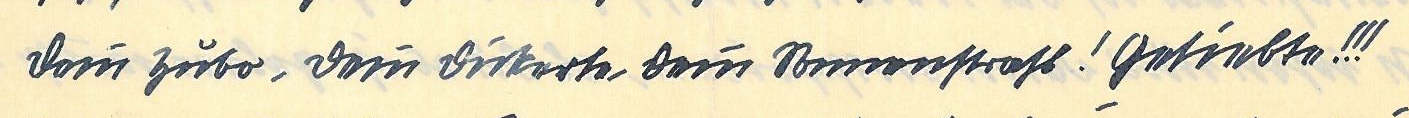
Dein Hubo, Dein Dickerle, Dein Sonnenstrahl! Geliebte!!!
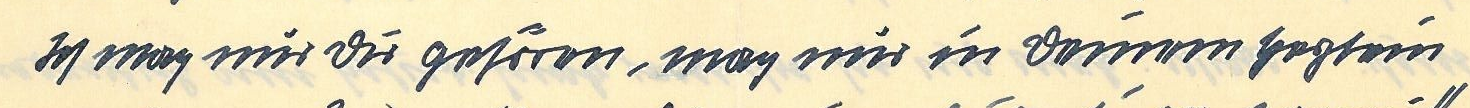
Ich mag nur Dir gehören, mag nur in Deinem Herzlein
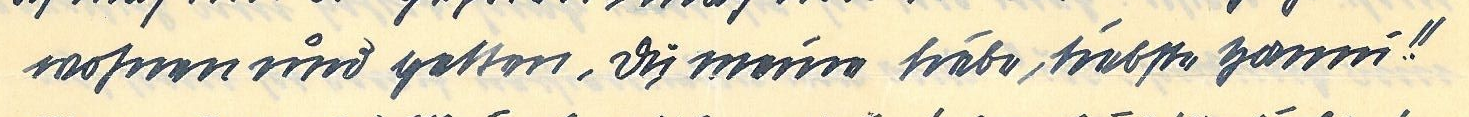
wohnen und gelten, Du meine liebe, liebste !!
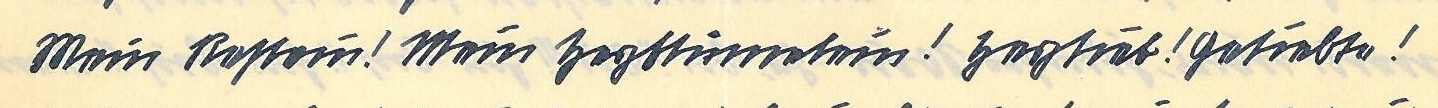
Mein Rehlein! Mein Herzblümelein! Herzlieb! Geliebte!
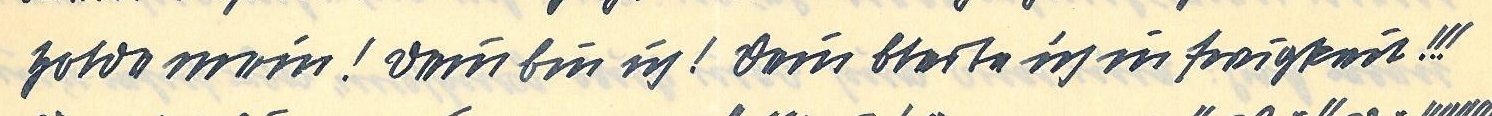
Holde mein! Dein bin ich! Darin bleibe ich in Ewigkeit!!!
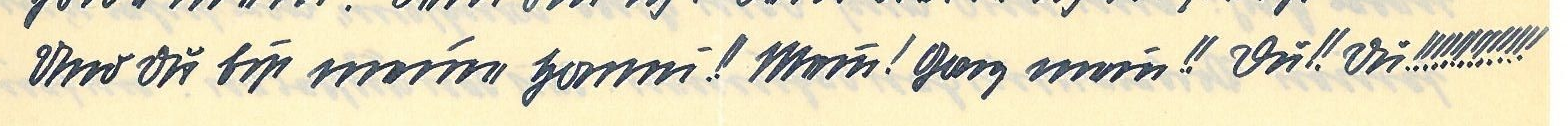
Und Du bist meine !! Mein! Ganz mein!! Du!! Du!!!!!!!!!!!!!
